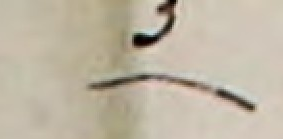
3
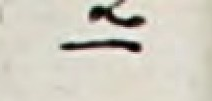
2
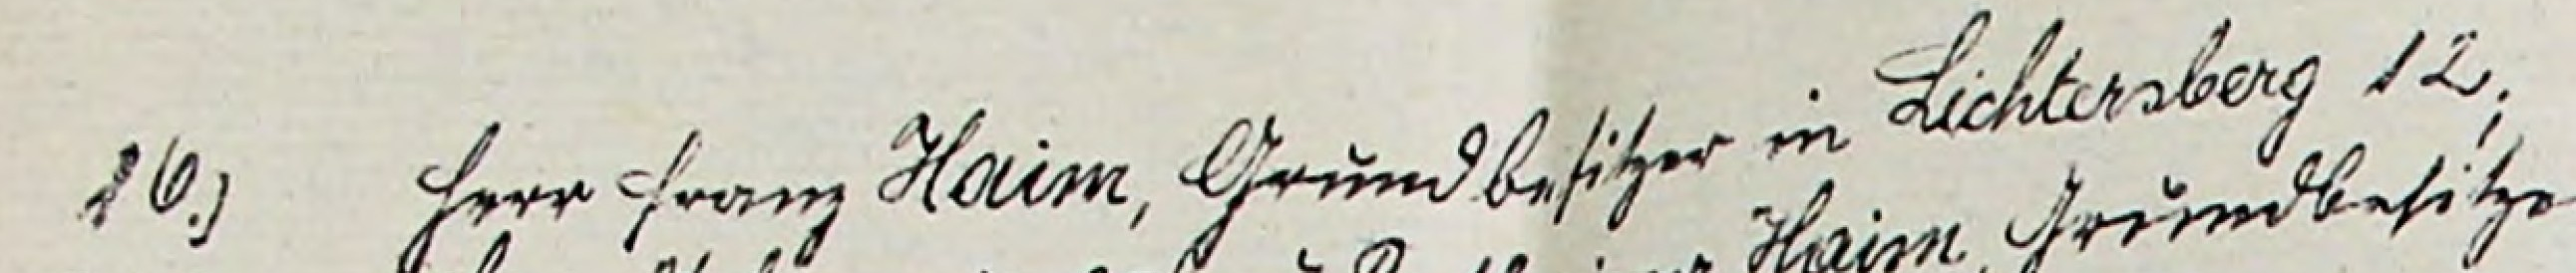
26.) Herr Franz Haim, Grundbesitzer in Lichtersberg 12;
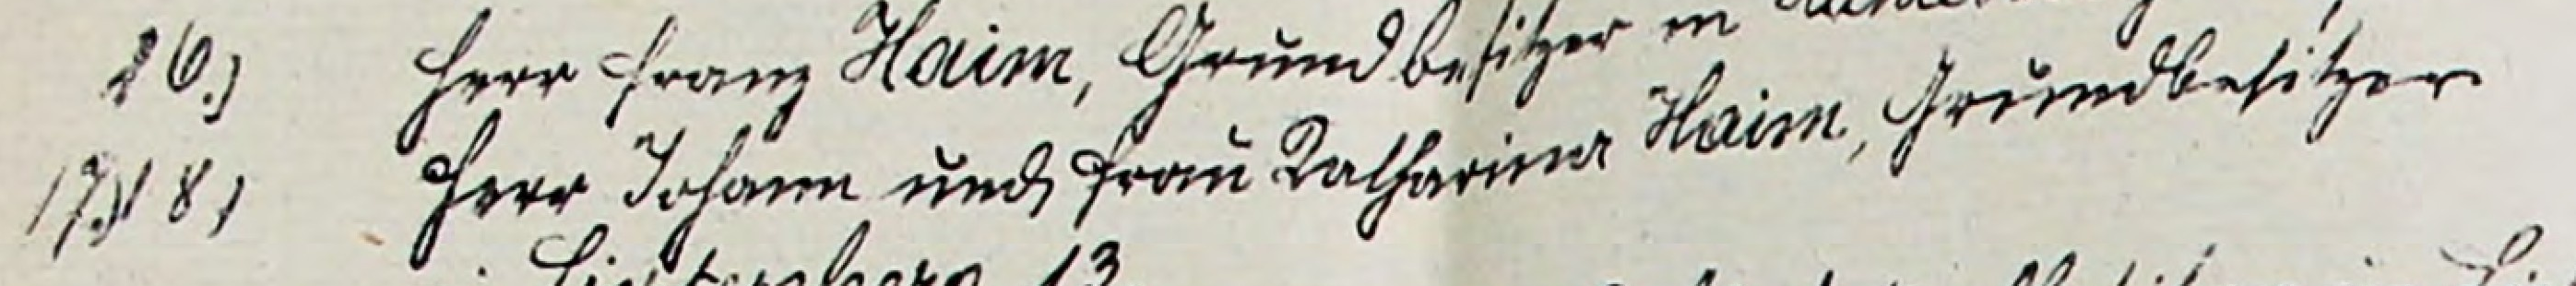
17.) 18.) Herr Johann und Frau Katharina Haim, Grundbesitzer
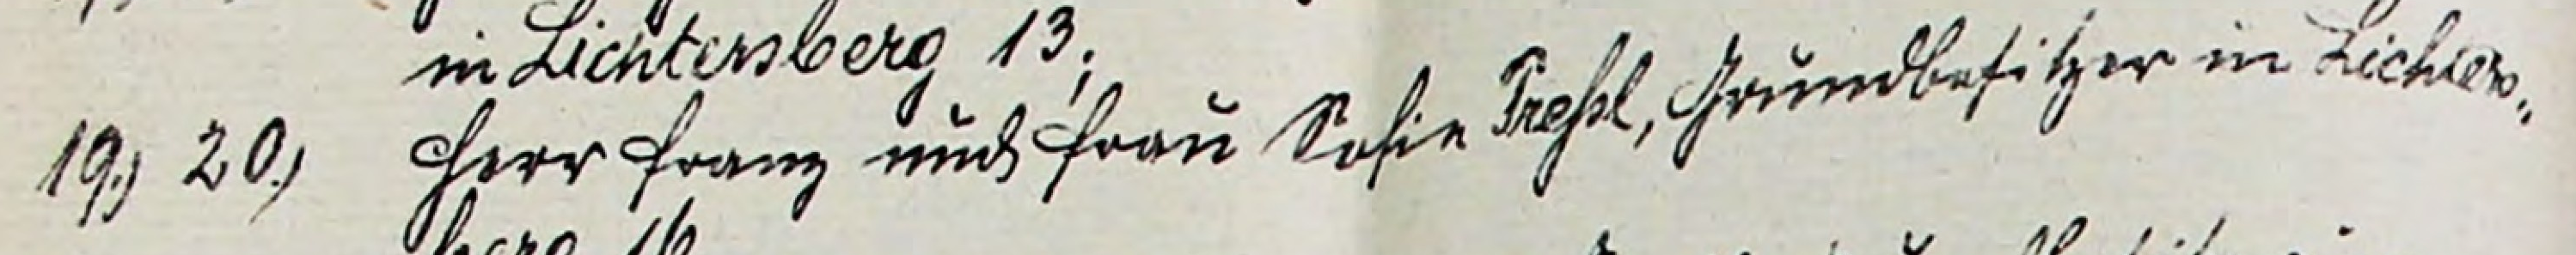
in Lichtersberg 13;
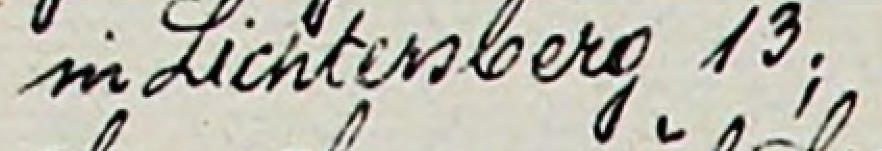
19.) 20.) Herr Franz und Frau Sofie Tressl, Grundbesitzer in Lichters„
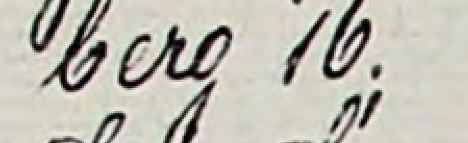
berg 16.
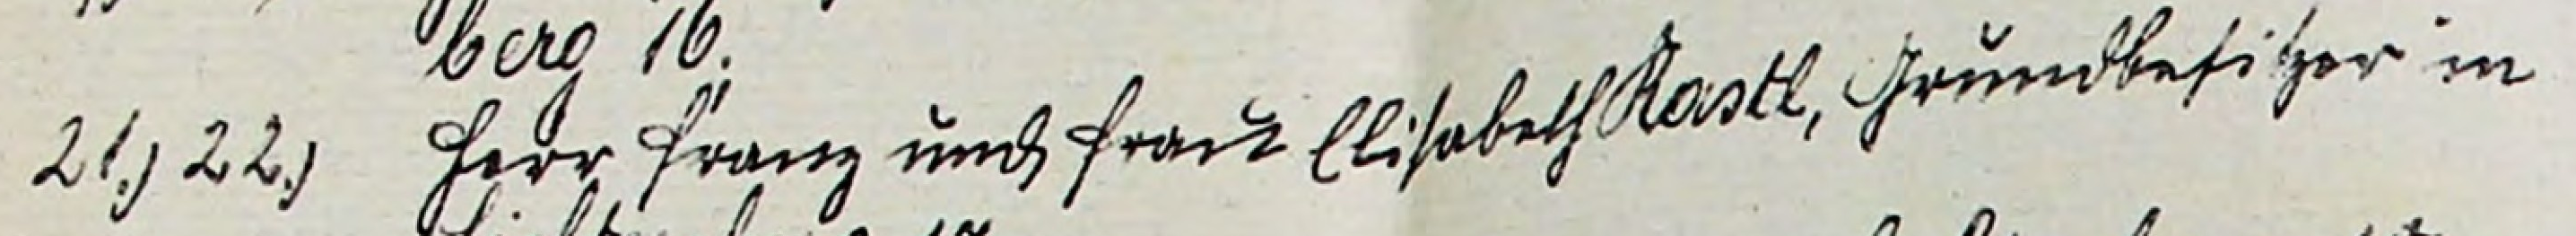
21.) 22.) Herr Franz und Franz Elisabeth Rastl, Grundbesitzer in
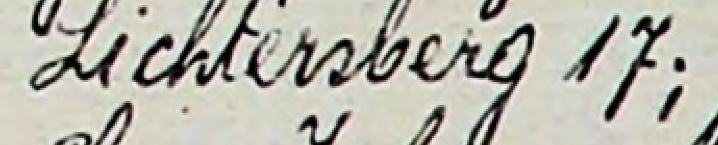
Lichtersberg 17;
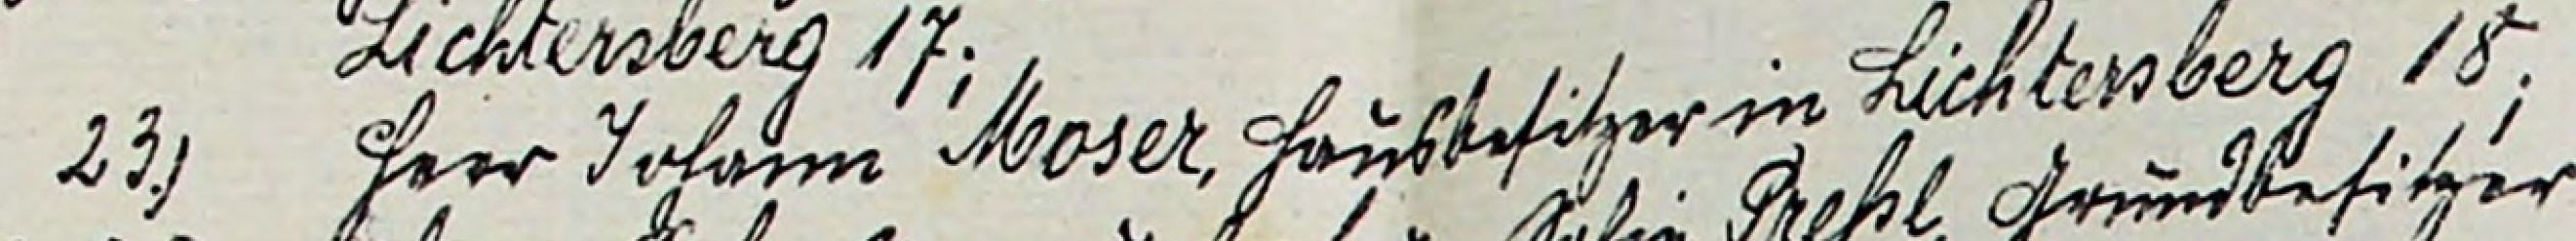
23.) Herr Johann Moser, Hausbesitzer in Lichtersberg 18;
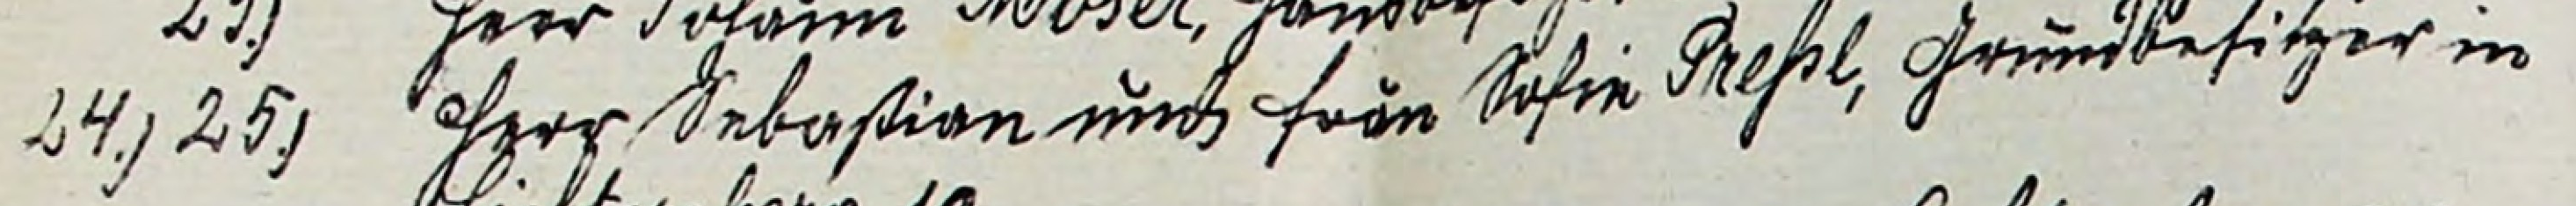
24.) 25.) Herr Sebastian und Frau Sofie Pressl, Grundbesitzer in
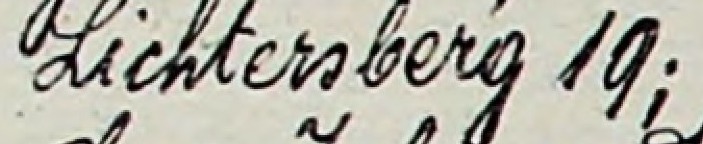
Lichtersberg 19;
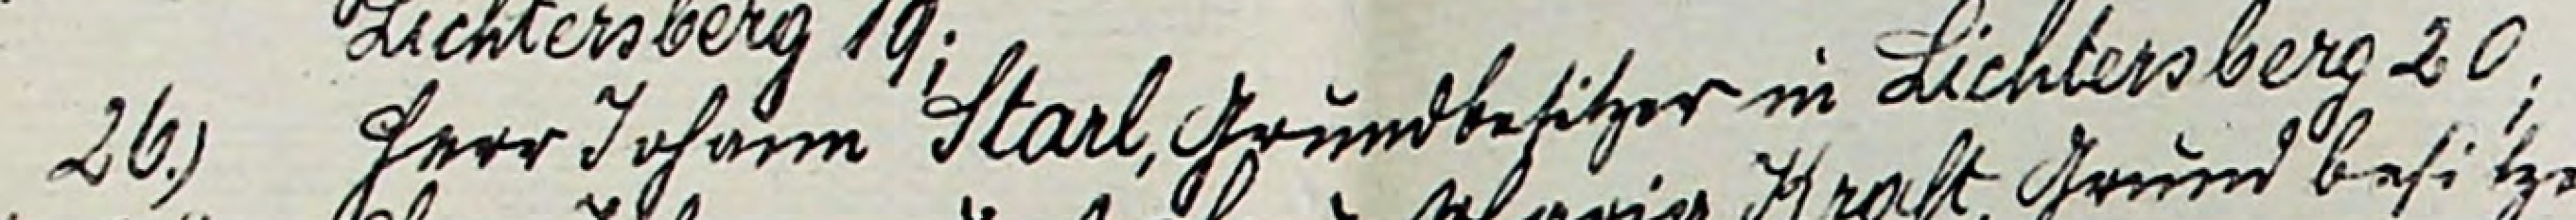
26.) Herr Johann Starl, Grundbesitzer in Lichtersberg 20;
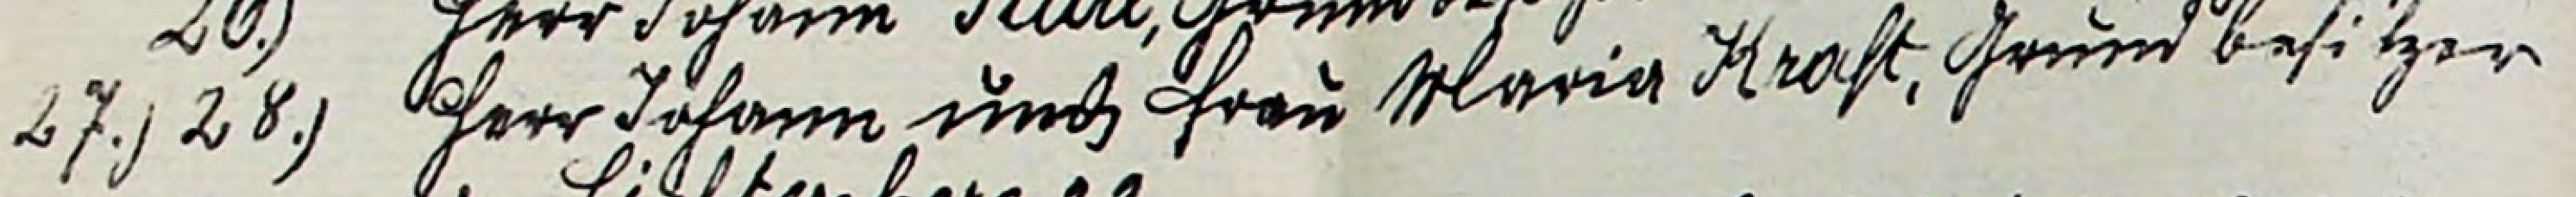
27.) 28.) Herr Johann und Frau Maria Krast, Grundbesitzer
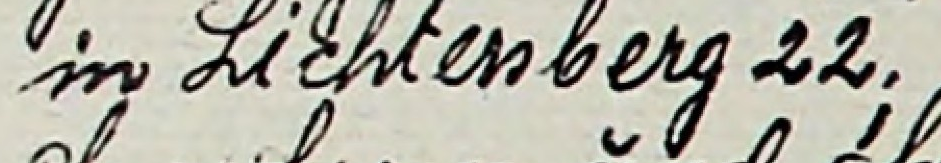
in Lichtersberg 22;
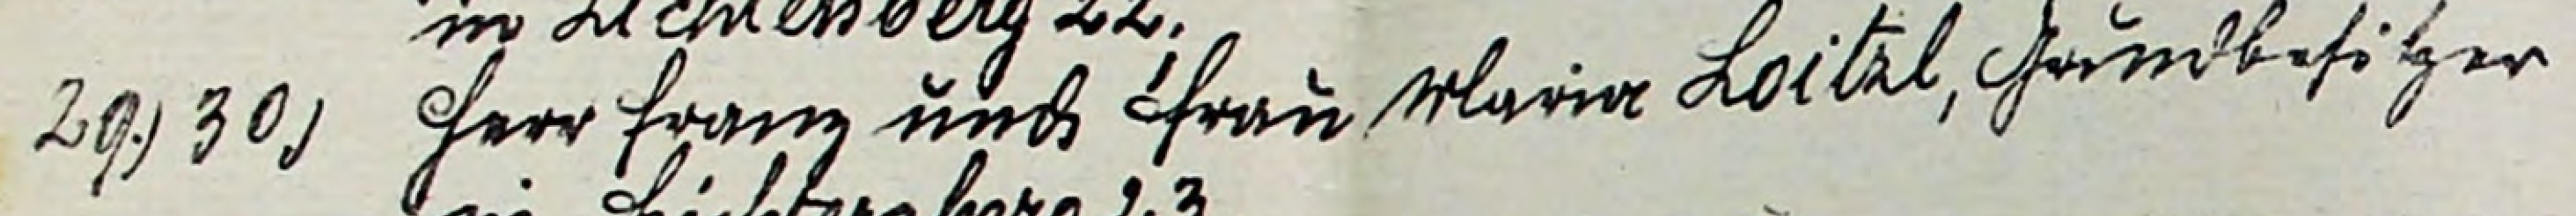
29.) 30.) Herr Franz und Frau Maria Loitzl, Grundbesitzer
